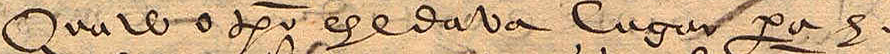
Quado o tp̄o lhe dava lugar ꝑa ho
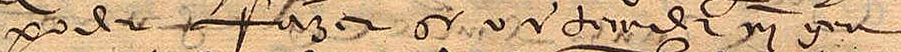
poder fazer sē o ētemder nj̄gen
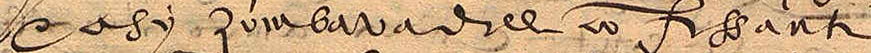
e asy zombava delle cōfessante
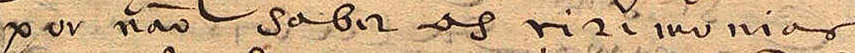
por não saber as çirimonias
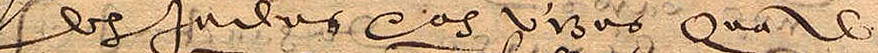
dos Judeus e as vezes Quādo
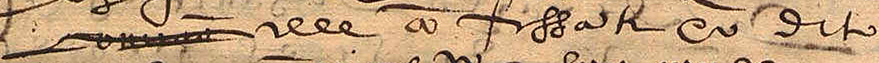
elle cōfessāte e o dito
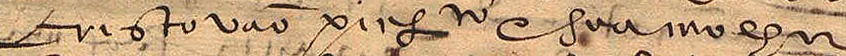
Cristovão pinhro e sua molher
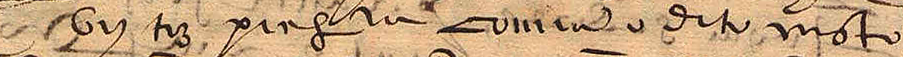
brjtiz pinhra comiā o dito cristo
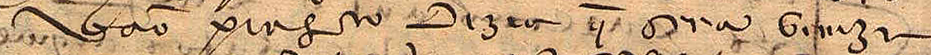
vaõ pinhro Dizia q̄ se nā bemze
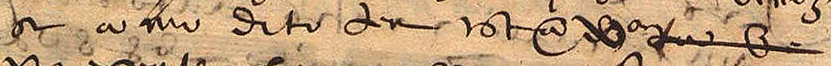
se como dito tem estā va
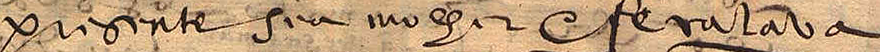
presente sua molher e se calava
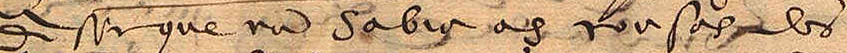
disse que nā sabia as cousas dos
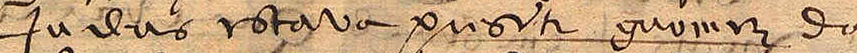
Judeus estava presēte guomez da
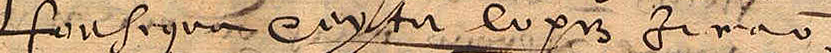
fonsequa e eytor lopez Jrmaõ
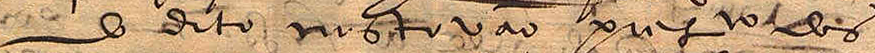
do dito cristovão pinhro dos
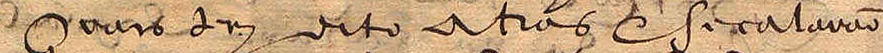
Quaes tem dito atras e se calauaõ
